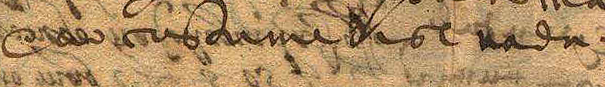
e ao custume dise nada
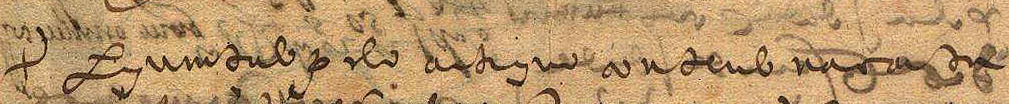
item ꝑgumtado pelo artiguo conteudo na carta
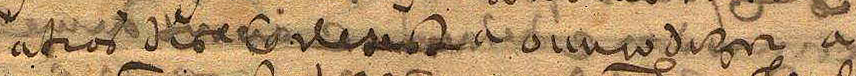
atras dise q̄ ele testa ouuio dizer a
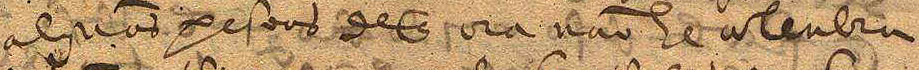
alguās pesoas de q̄ ora não he alenbra
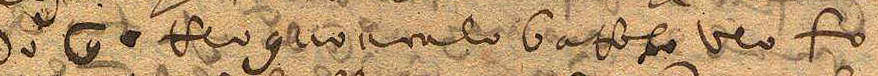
do q̄ o Reo guonçalo baRoso veo fo
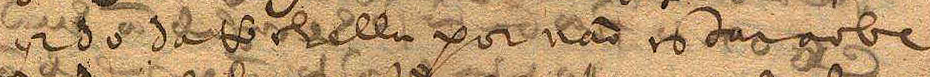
gido da Rochella por não estar a obe
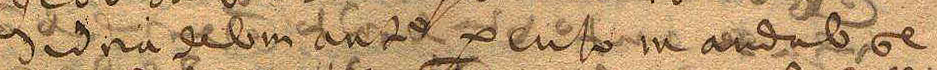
diēcia de dom anto ꝑ cuJo mandado se
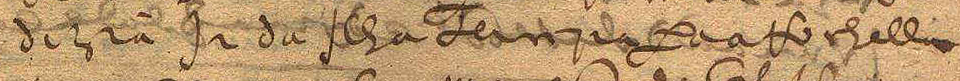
dizia Jr da Jlha tercejra ꝑa a Rochella
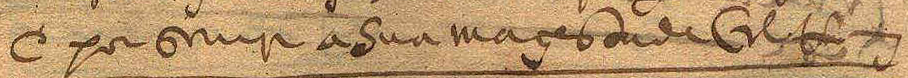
e por serujr a Sua magestade El Rey
